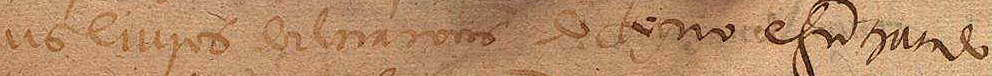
us liuros dordenacõees do Regno e hū tratado
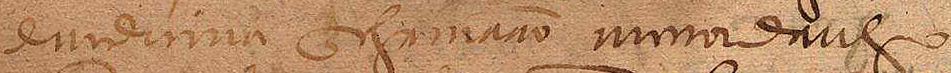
de medicina q̄ chamaão menor danho
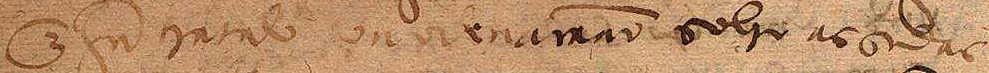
item hū tratado ou ordenacaão sobre as sedas
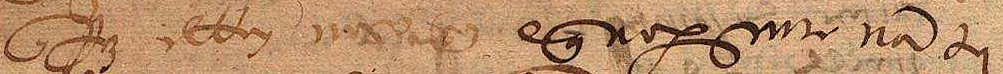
q̄ fez el Rey noso s̄or e q̄ no ꝑsente nā ty
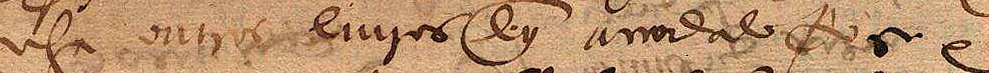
nha outros liuros de q̄ acordado fose e
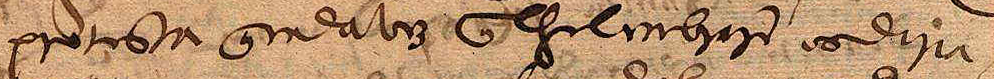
protesta q̄ cada vez q̄ lhe lenbrarē os dizia
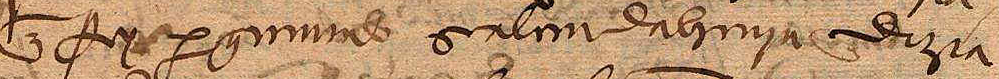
item foy ꝑgumtado se alem da briuja q̄ dizia
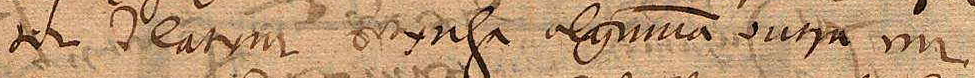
ter ē latym se tynha alguūa outra em
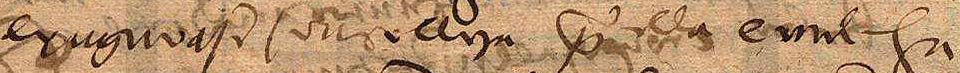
lynguoaJē / ou se llera p̄o ella e onde ha
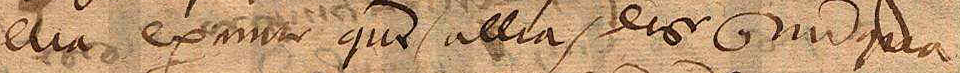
llia e ꝑamte quē / a llia / dise q̄ nūqua
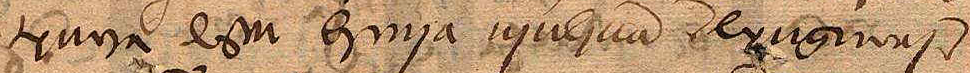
tyuera de seu briuja njnhūa ē lynguoaJē
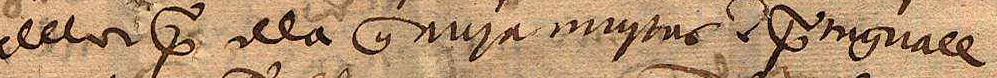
e de ller p̄o ella q̄ auja mujtas ē p̄otuguall
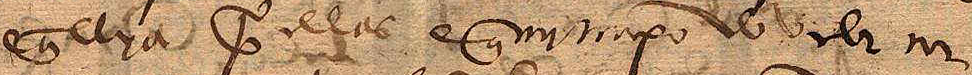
e q̄ llya p̄o ellas e q̄ em tenpo do vedor cor
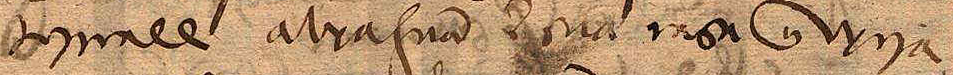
terreall avya huā ē sua casa q̄ vyera
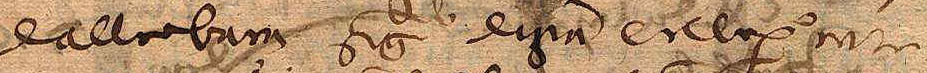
dallcobaça segdo diziā e elle ꝑo corte
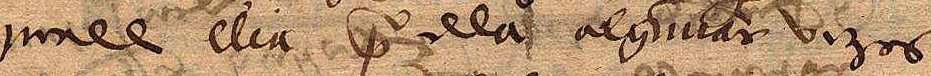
rreall llia p̄o ella algūuas vezes
